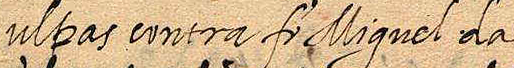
Culpas contra fr̅ Miguel da
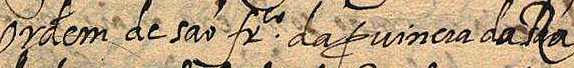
ordem de são frco. da ꝓuincia daRá
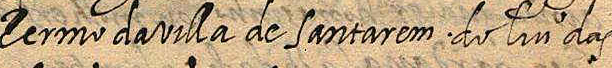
termo da villa de Santarem. do liuo das
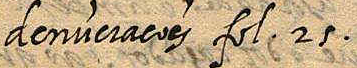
denu̅ciacoēs fol.25.
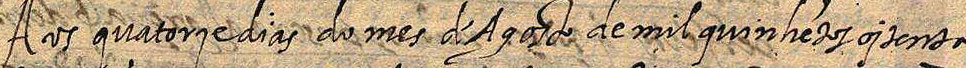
Aos quatorze dias do mes d´Agosto de mil quinhe̅tos ojtenta
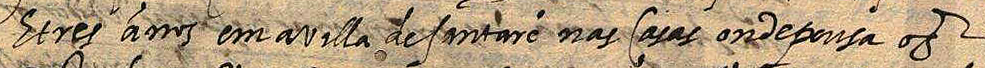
E tres a̅nos em a villa de santare̅ nas Casas onde pousa o sr
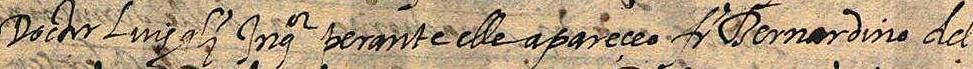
Doctor Luis glz̅ Jnqor perante elle apareçeo fr̅ Bernardino del
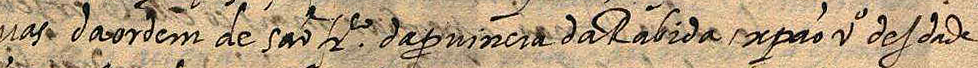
uas da ordem de são frco. da ꝓuincia daRabida, xpão vo de jdade
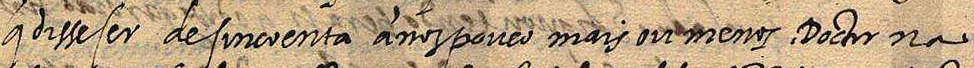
q̅ disse ser de sincoenta a̅nos pouco mais ou menos. Doctor na
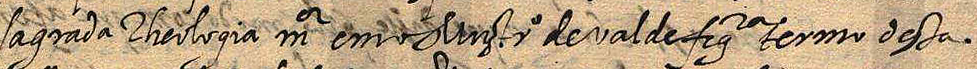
sagrada Theologia mor em o Mustro de val de figra termo desta
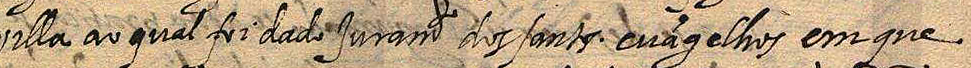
villa ao qual foi dado Juramto dos santos eua̅gelhos em que
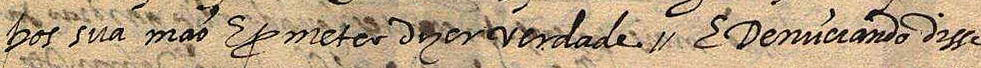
pos sua mão E p̅ometeo dizer verdade // E Denu̅ciando disse
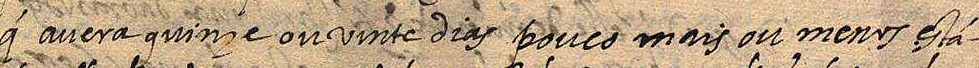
q̅ auera quinze ou vinte dias pouco mais ou menos esta̅
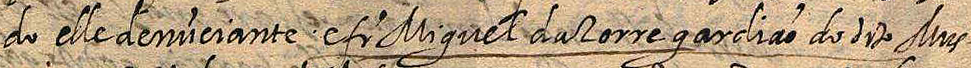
do elle denu̅ciante e fr̅ Miguel da torre gardião do dito Mus
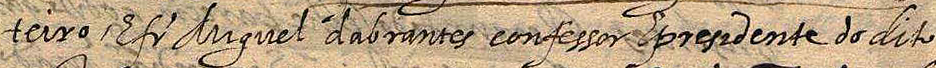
teiro, E fr̅ Miguel dabrantes confessor E presidente do dito
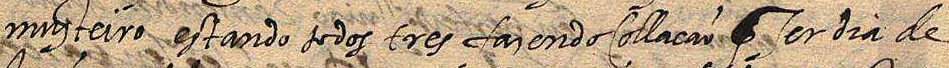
musteiro estando todos tres fazendo Collação p̅o ser dia de
